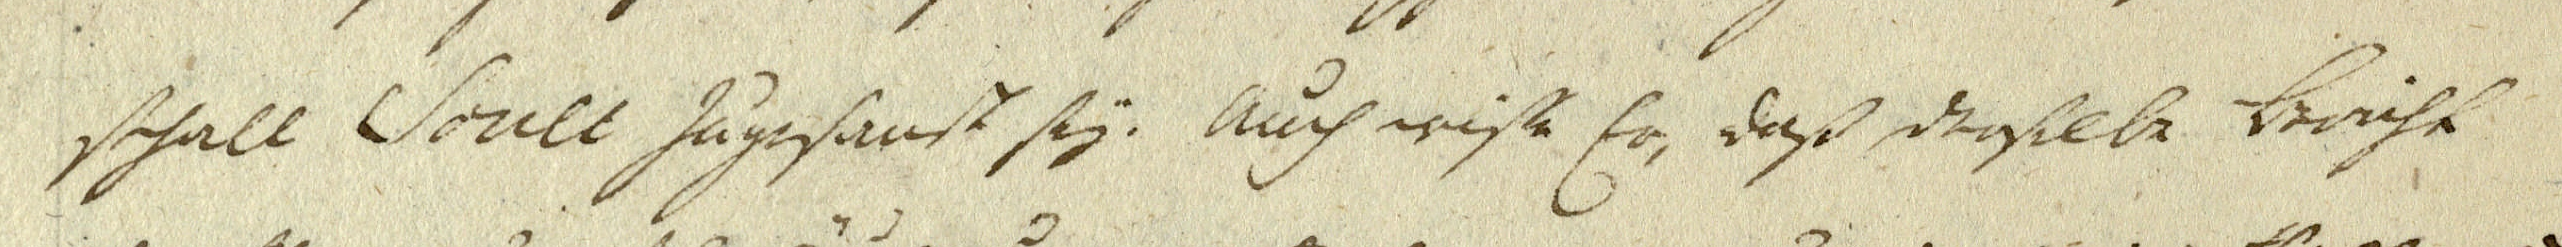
schall Soult zugesandt seÿ. Auch wisse Er, daß derselbe Bericht
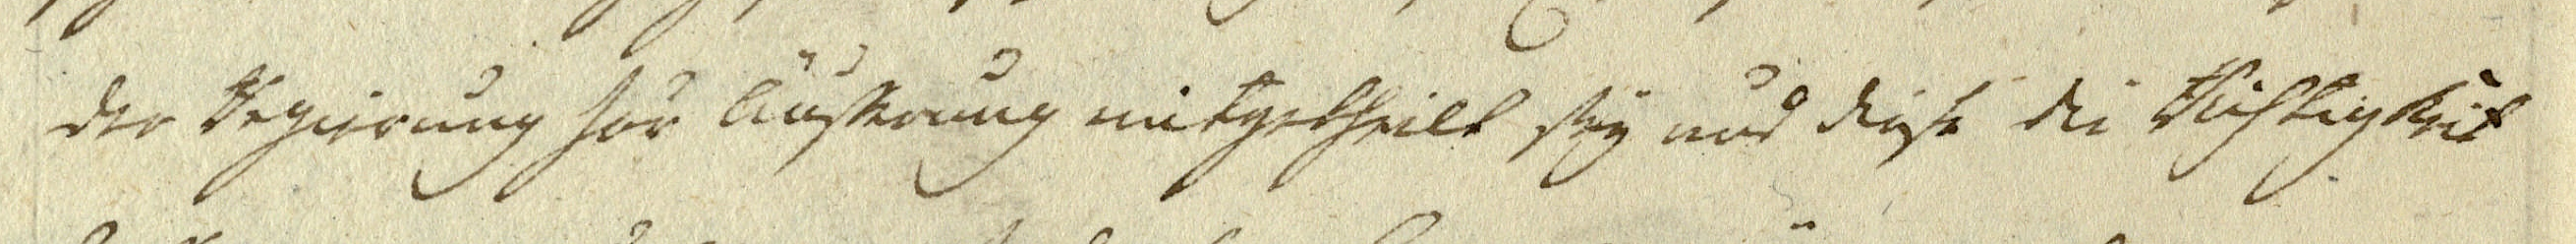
der Regierung zur Äusserung mitgetheilt seÿ und diese die Richtigkeit
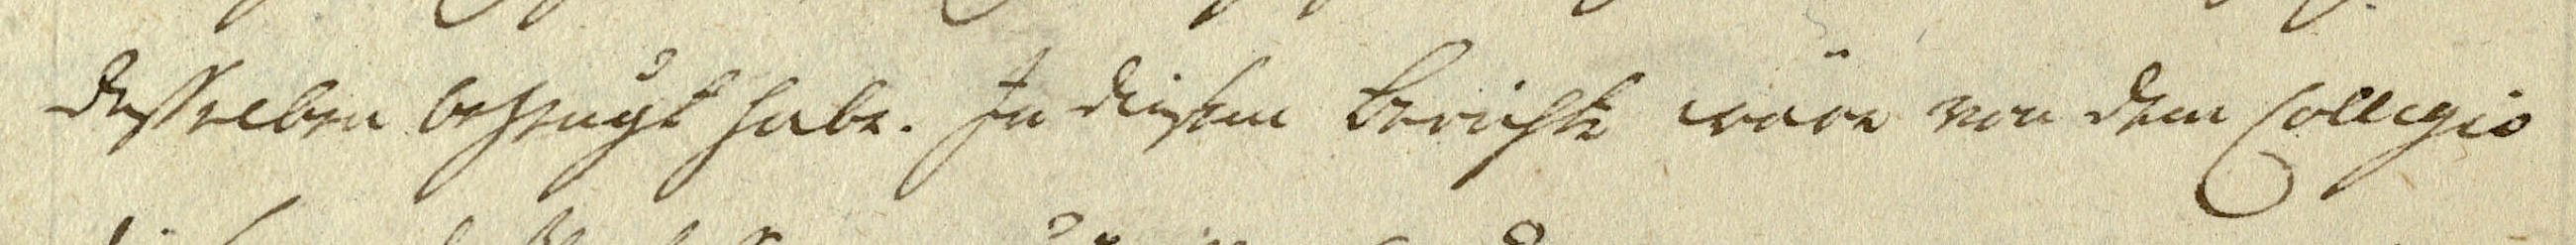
desselben bezeugt habe. In diesem Berichte wäre von dem Collegio
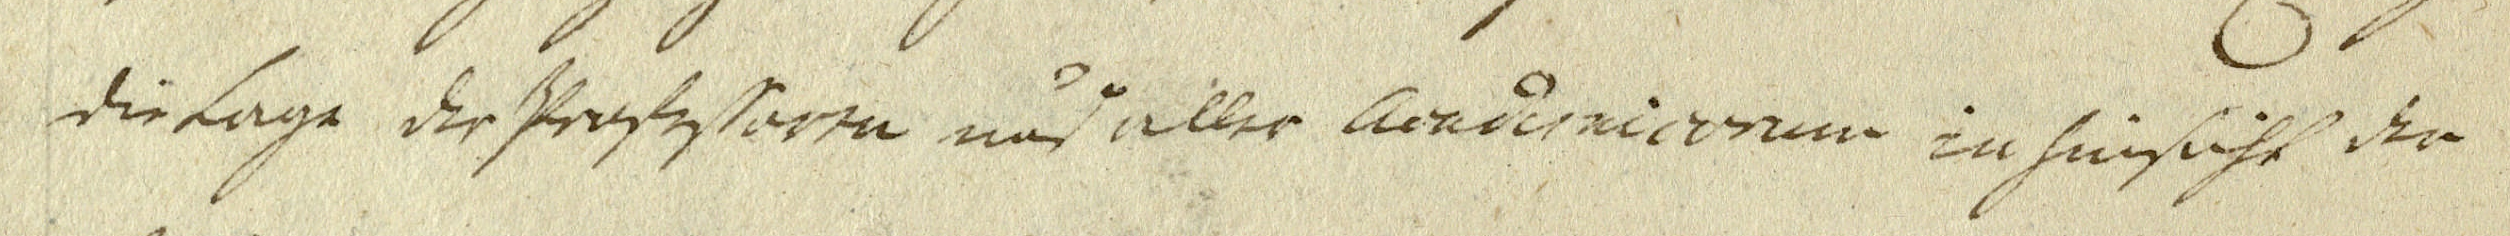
die Lage der Professoren und aller Academicorum in Hinsicht der
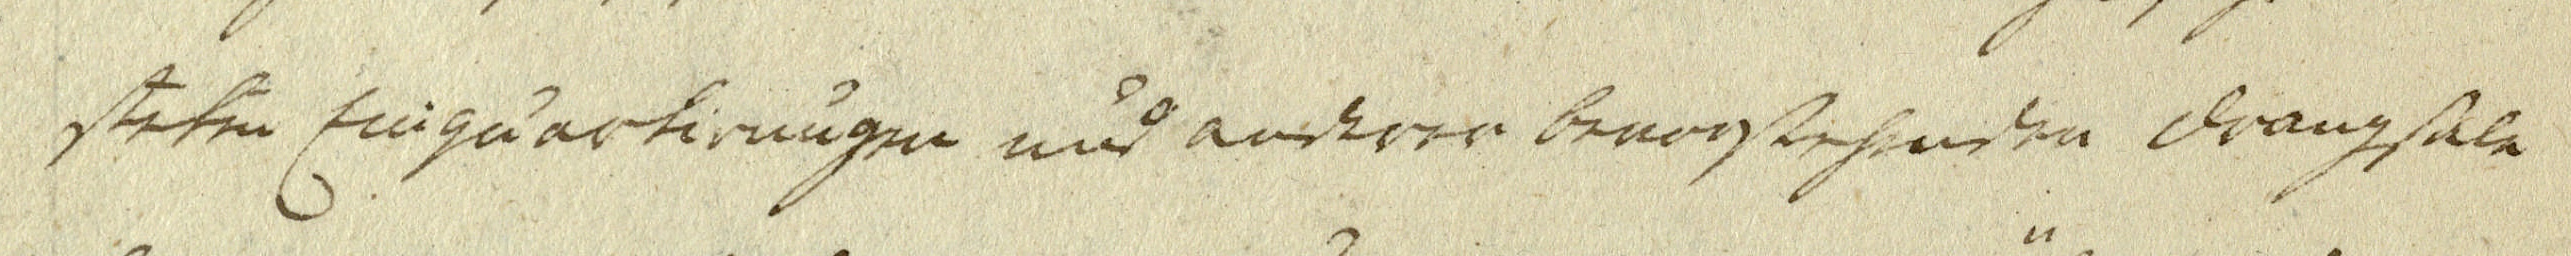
stehen Einquartirungen und anderer bevorstehenden Drangsale
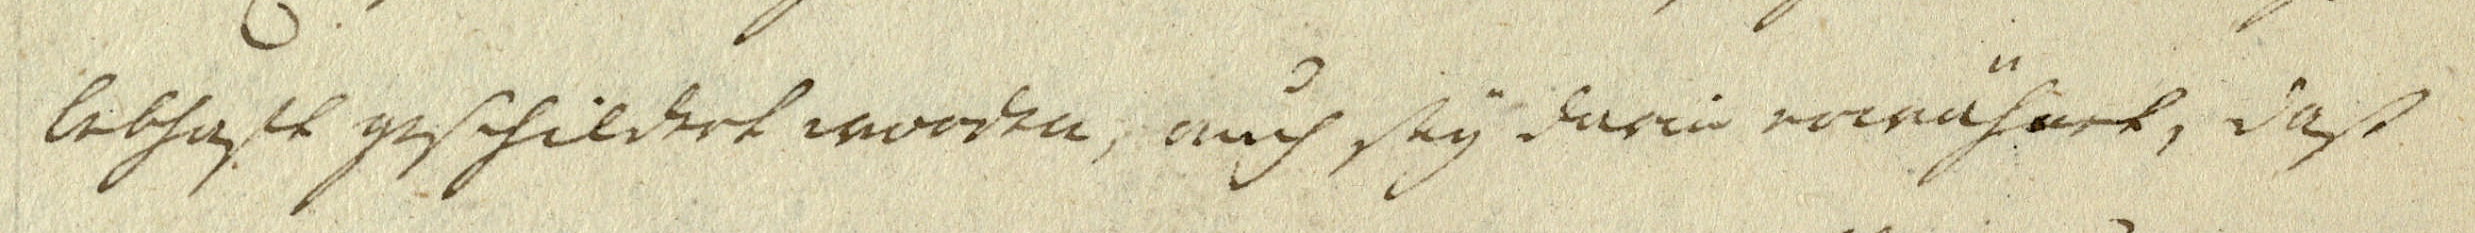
lebhaft geschildert worden, auch seÿ darin erwähnet, daß
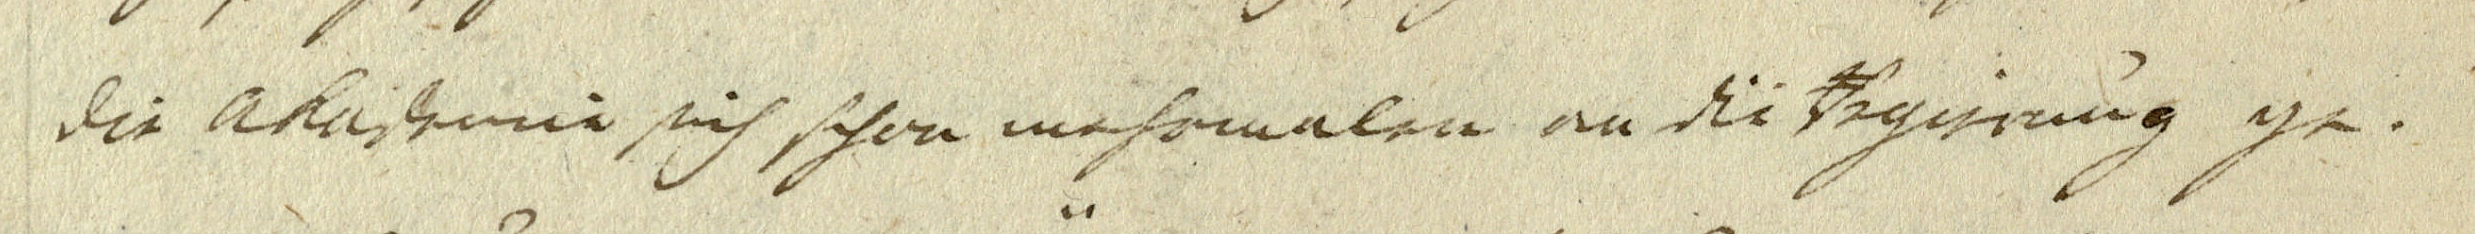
die Akademie sich schon mehrmalen an die Regierung ge¬
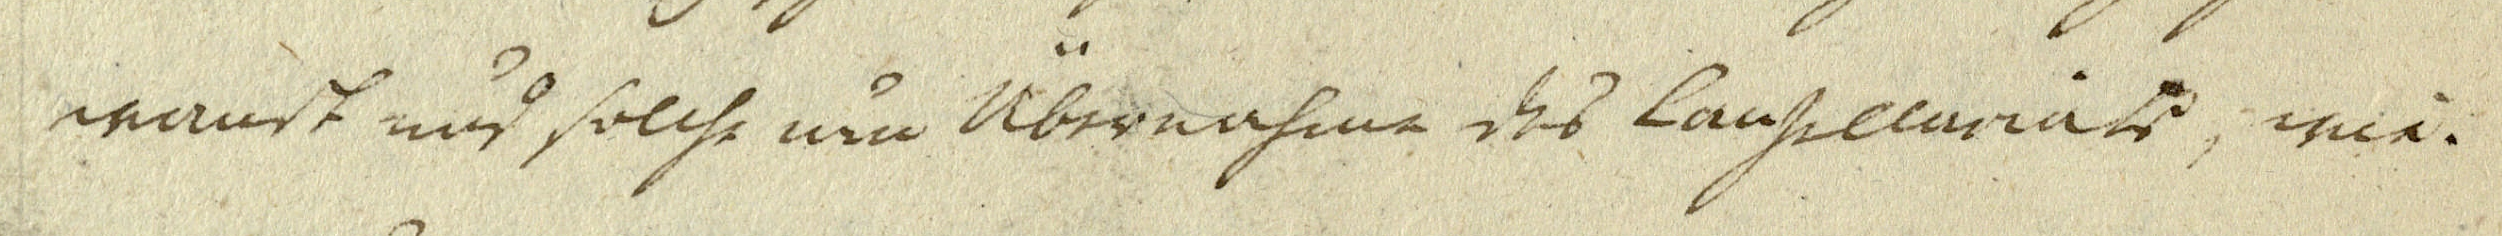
wandt und solche um Übernahme des Canzellariats, wie¬
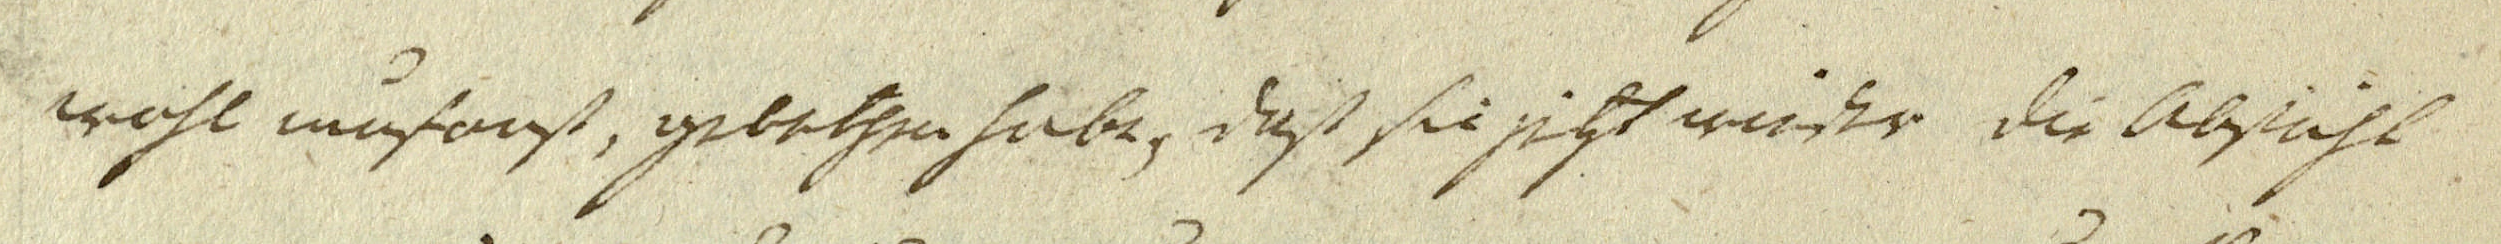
wohl umsonst, gebethen habe, daß sie jetzt wieder die Absicht
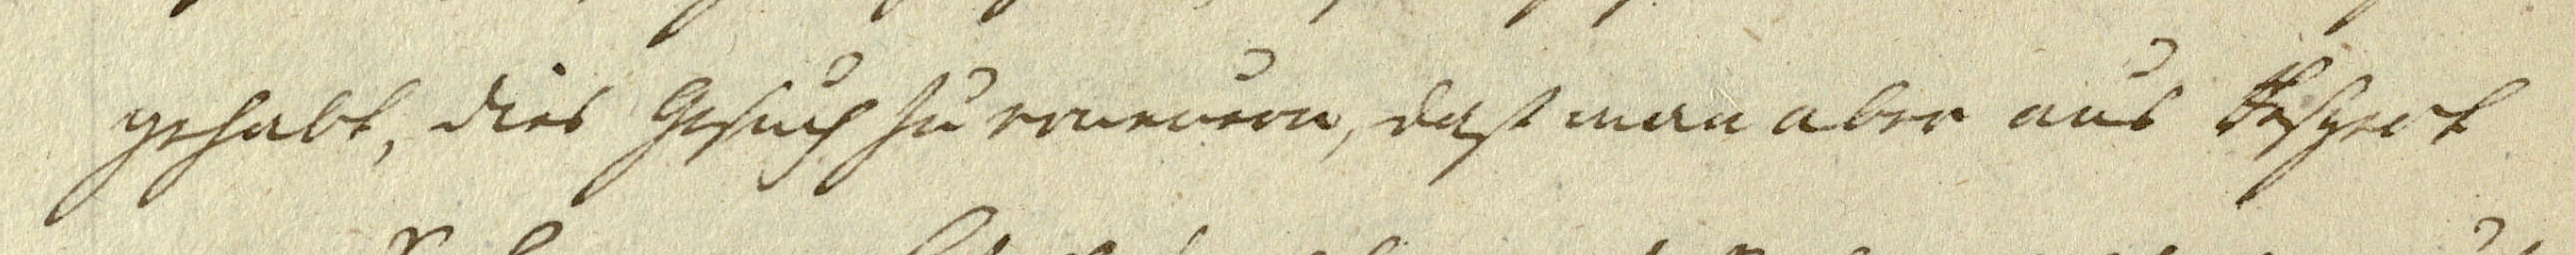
gehabt, dies Gesuch zu erneuern, daß man aber aus Respect
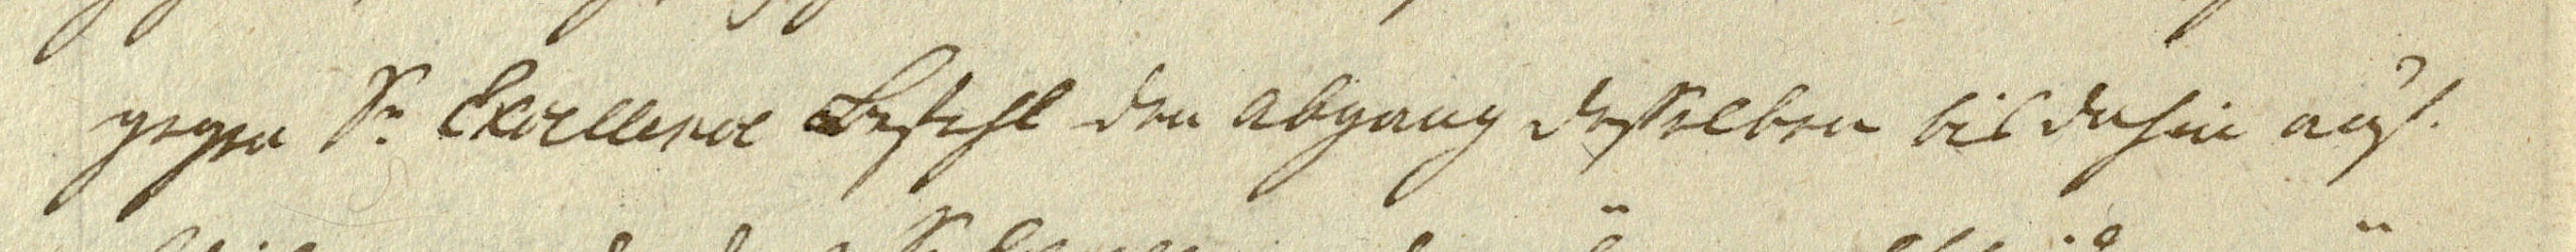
gegen Sr. Excellence Befehl den Abgang desselben bis dahin auf¬
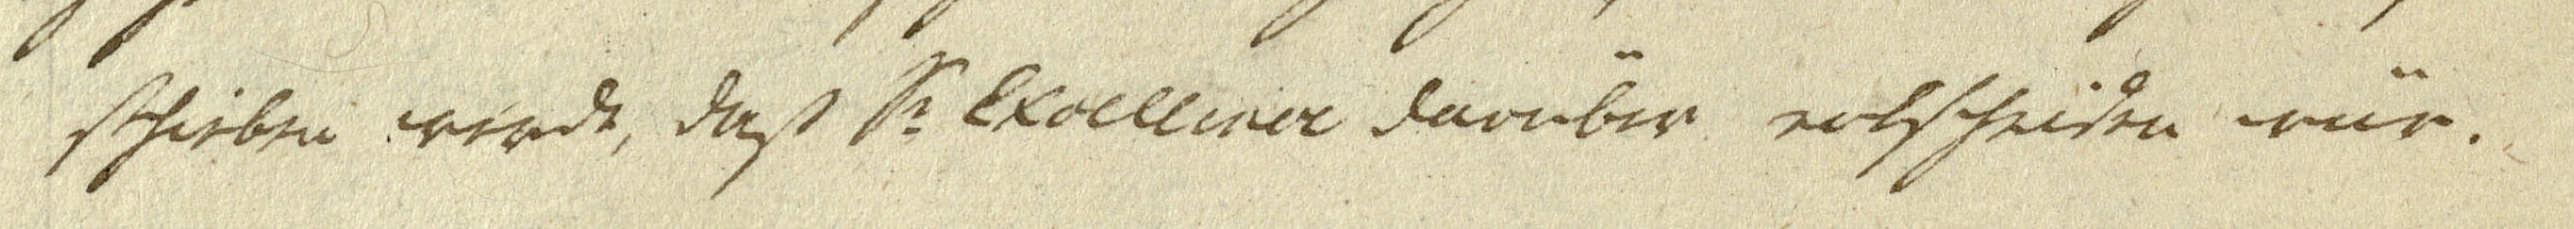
schieben werde, daß Sr Excellence darüber entscheiden wür¬
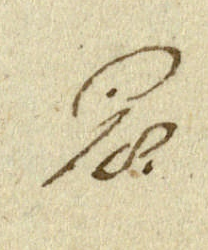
18.
